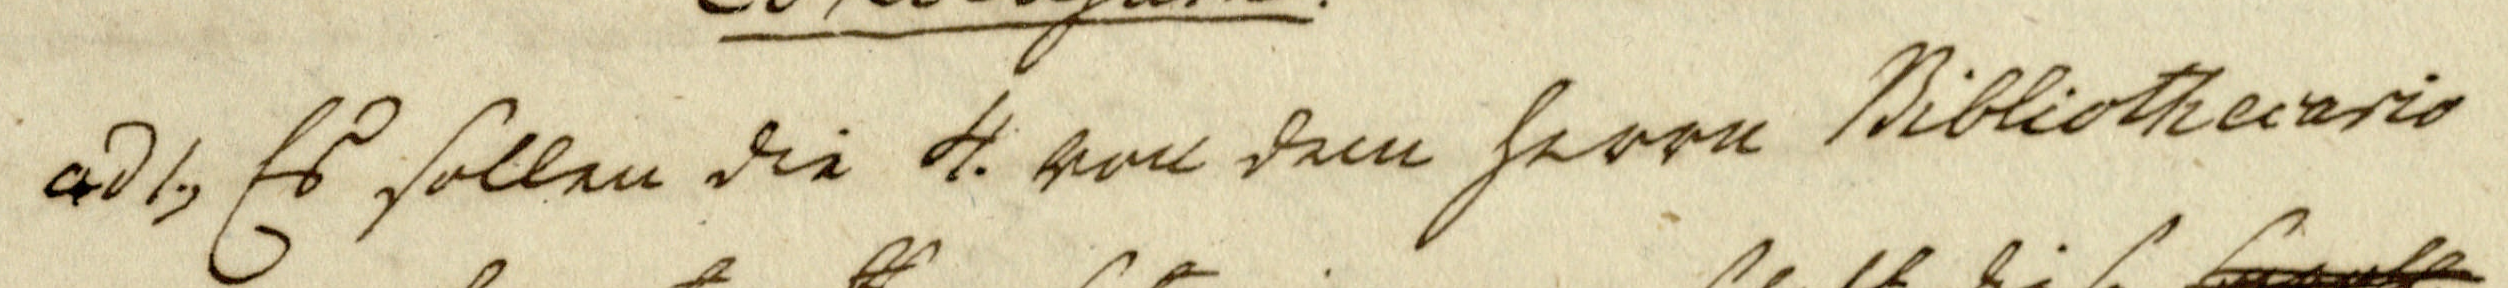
ad 1., Es sollen die 4. von dem herrn Bibliothecario
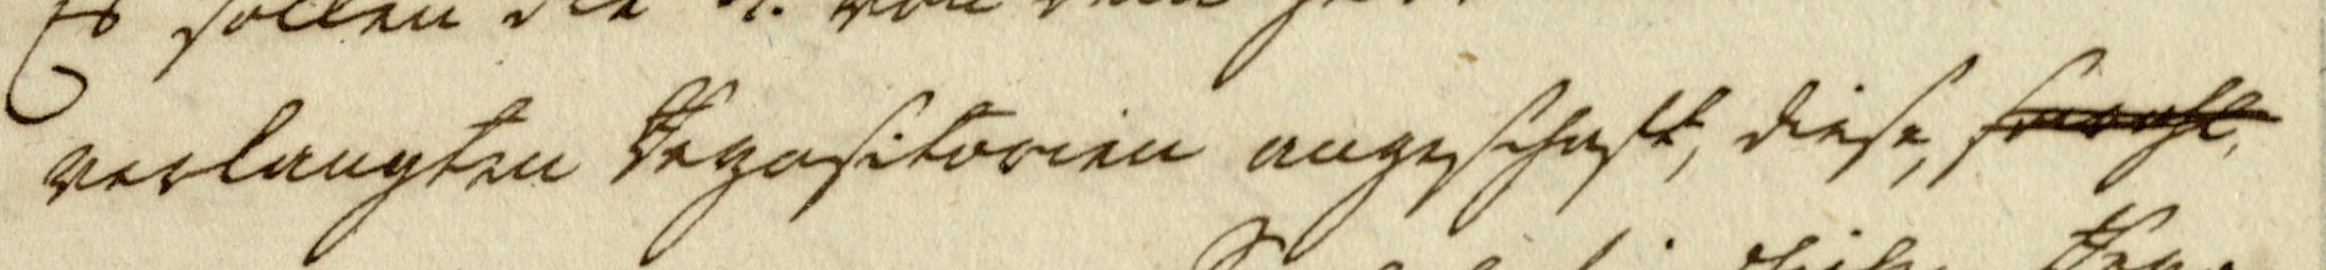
verlangten Repositorien angeschaft, diese sowohl
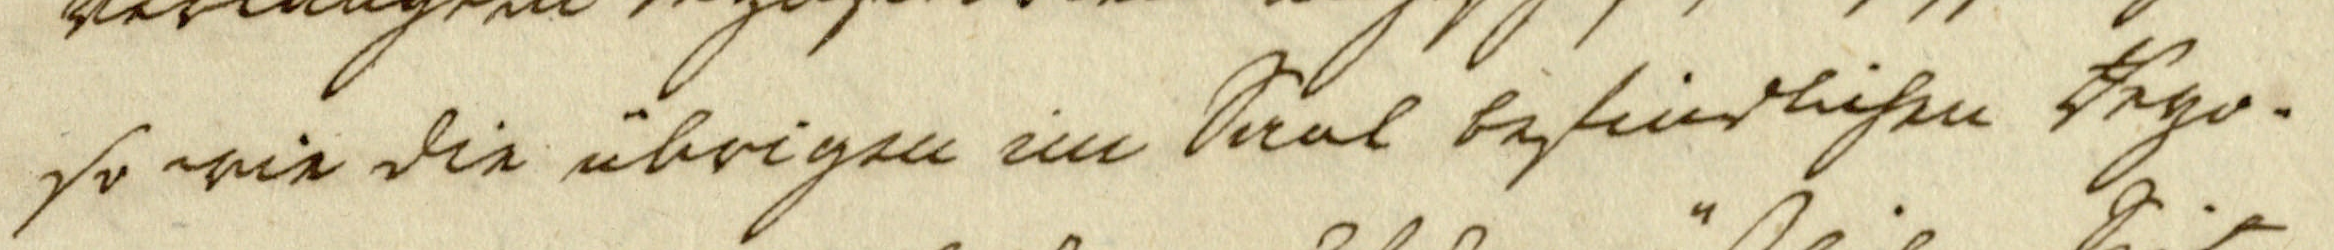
so wie die übrigen im Saal befindlichen Repo¬
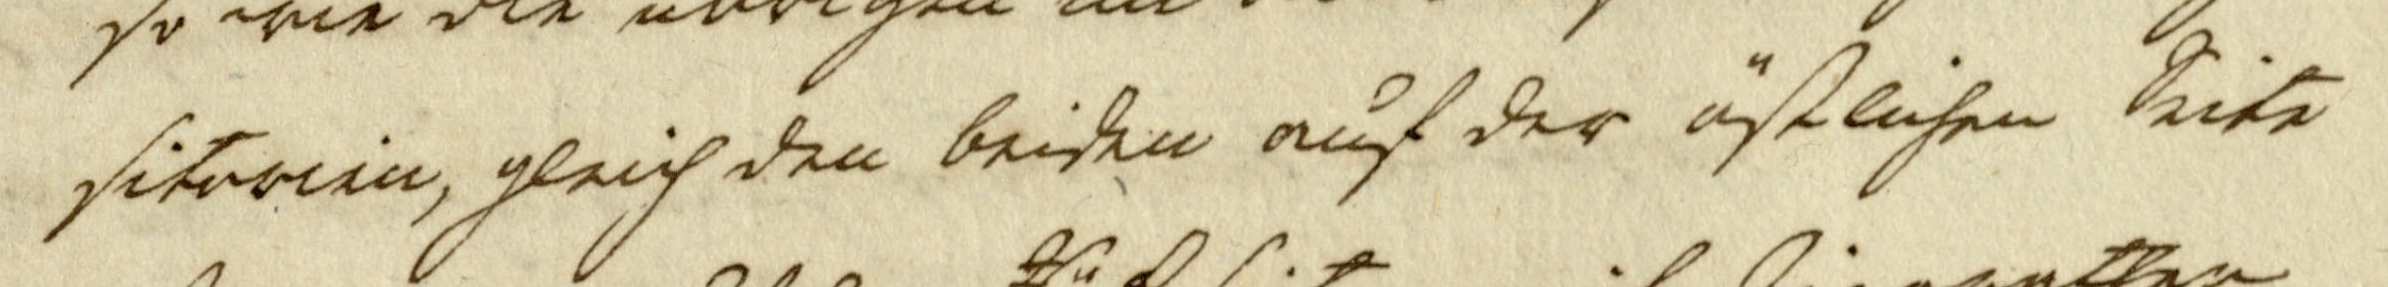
sitorien, gleich den beiden auf der östlichen Seite
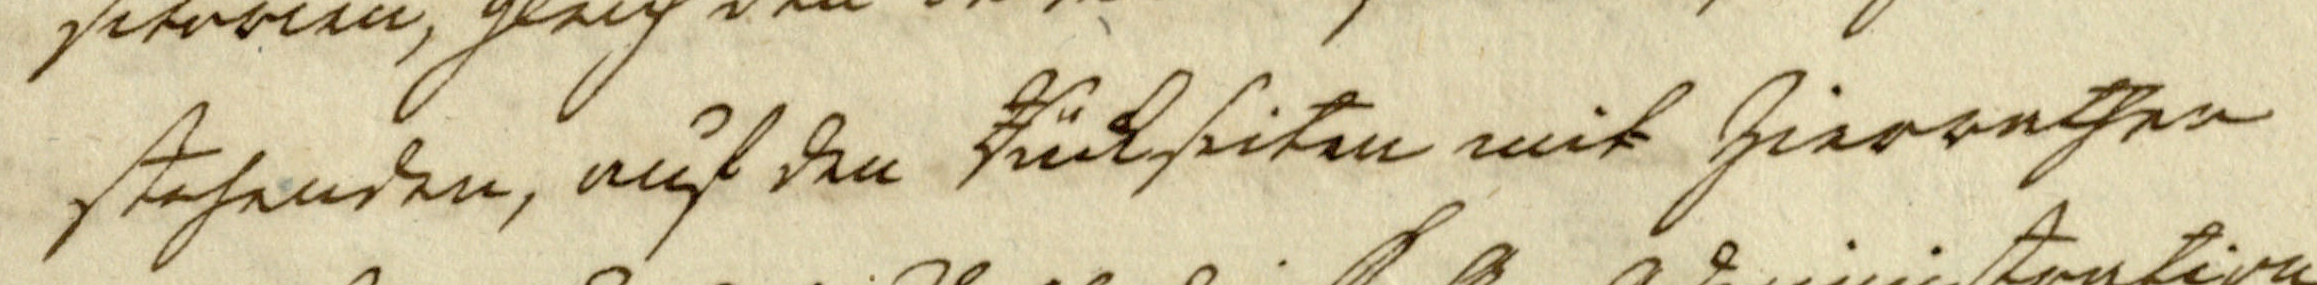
stehenden, auf den Rückseiten mit Zierrathen
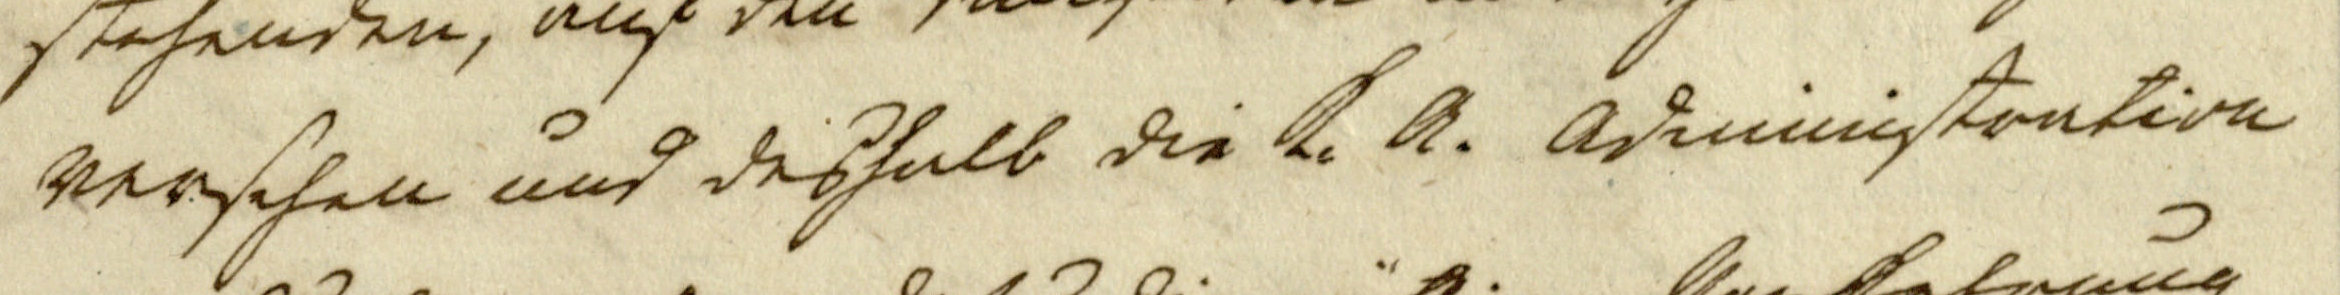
versehen und deshalb die K. A. Administration
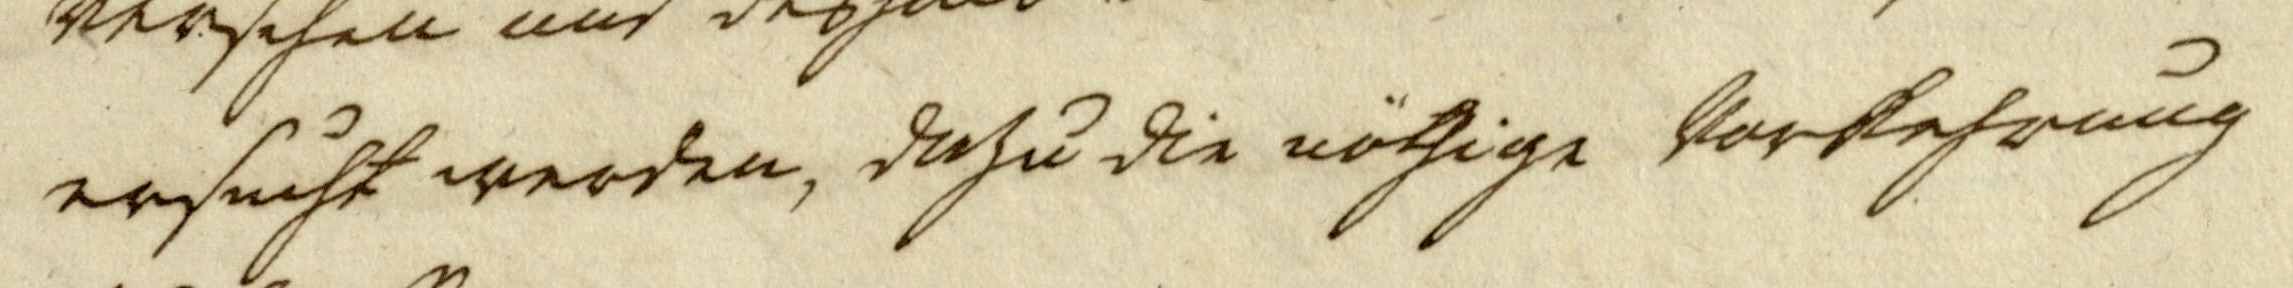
ersucht werden, dazu die nöthige Vorkehrung
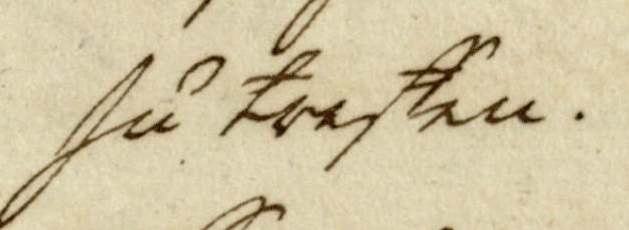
zu treffen.
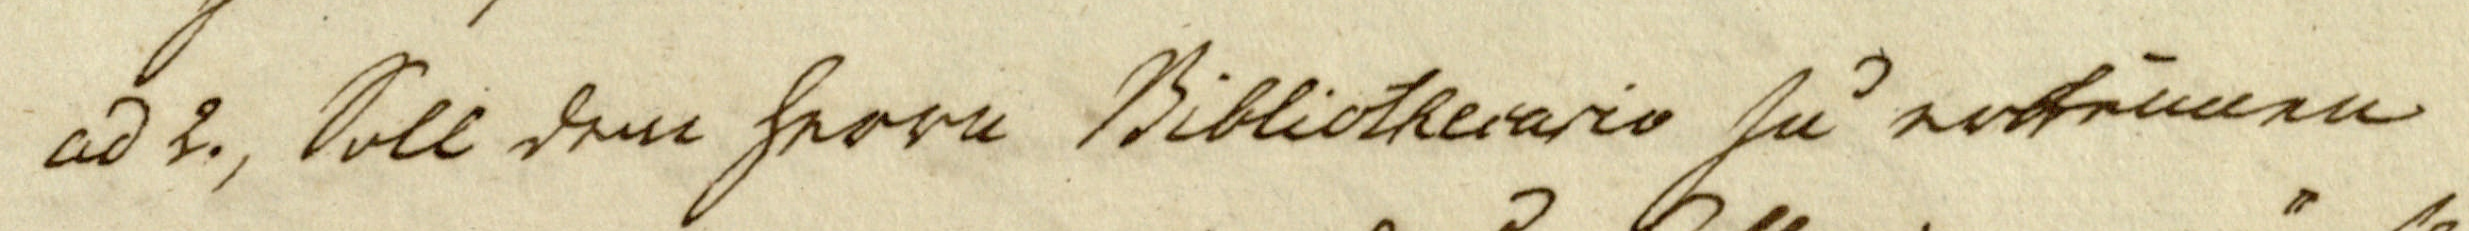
ad 2., Soll dem herrn Bibliothecario zu erkennen
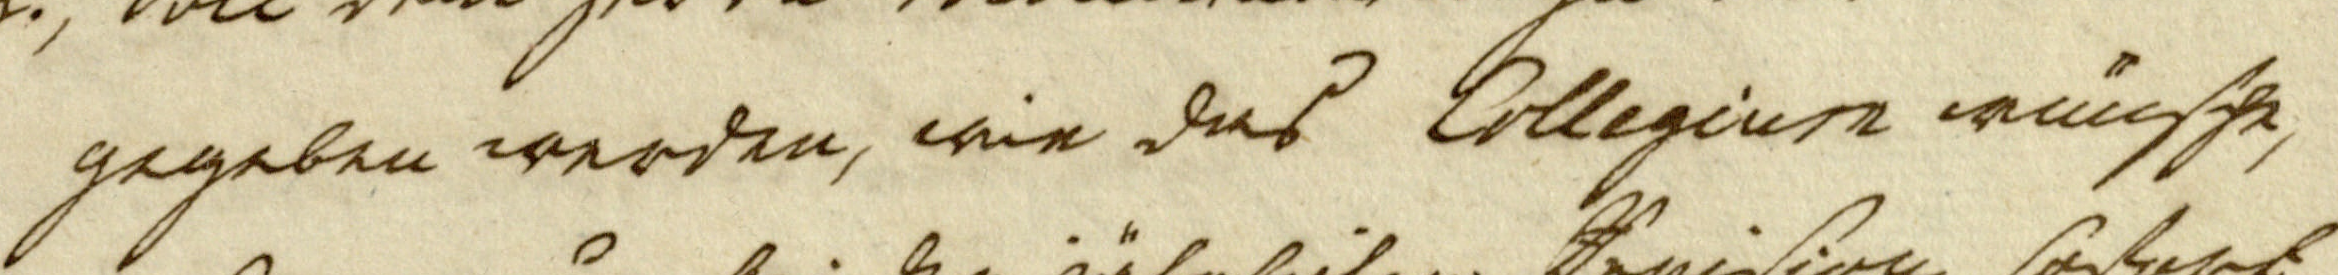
gegeben werden, wie das Collegium wünsche,
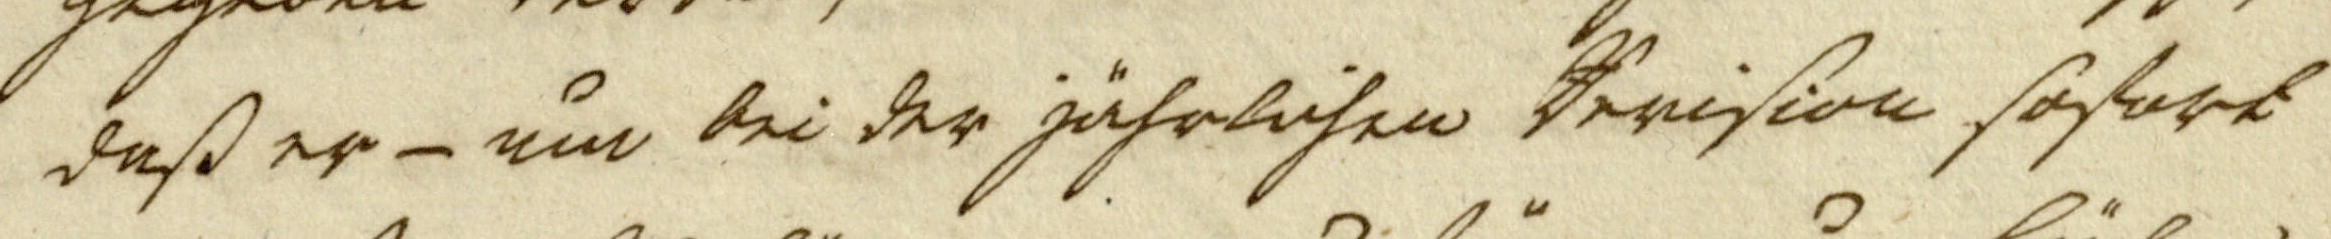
daß er um bei der jährlichen Revision sofort
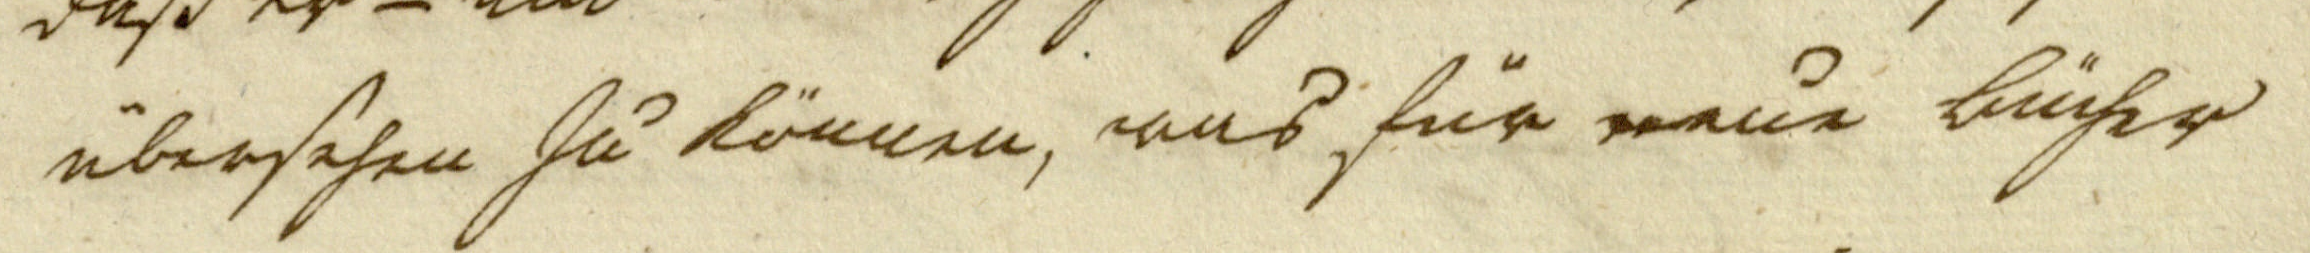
übersehen zu können, was für neue Bücher
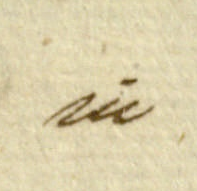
in
